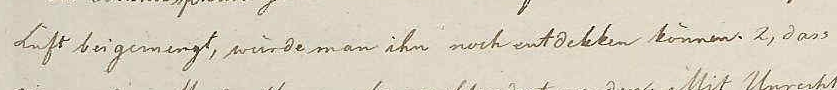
Luft beigemengt, würde man ihn noch entdekken können. 2, dass
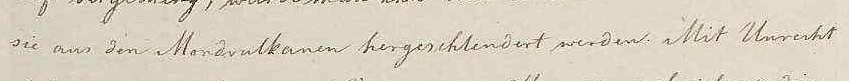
sie aus den Mondvulkanen hergeschleudert werden. Mit Unrecht
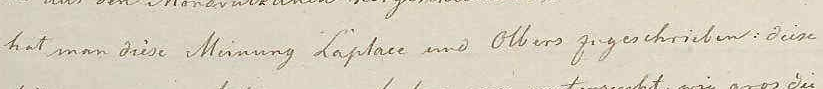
hat man diese Meinung Laplace und Olbers zugeschrieben: diese
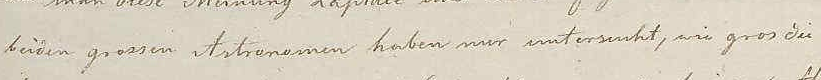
beiden grossen Astronomen haben nur untersucht, wie gros die
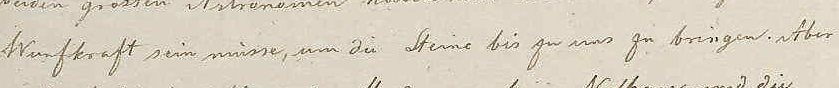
Wurfkraft sein müsse, um die Steine bis zu uns zu bringen. Aber
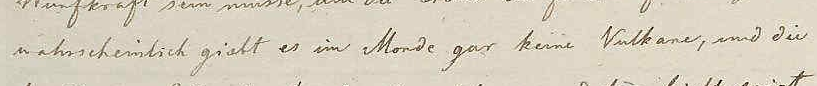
wahrscheinlich giebt es im Monde gar keine Vulkane, und die
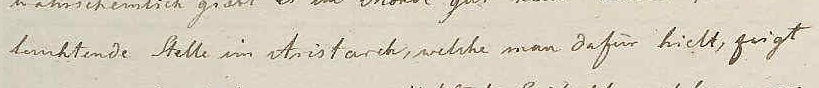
leuchtende Stelle im Aristarch, welche man dafür hielt, zeigt
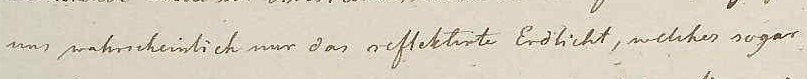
uns wahrscheinlich nur das reflektirte Erdlicht, welches sogar
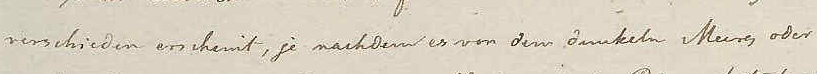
verschieden erscheint, je nachdem es von dem dunkeln Meere, oder
